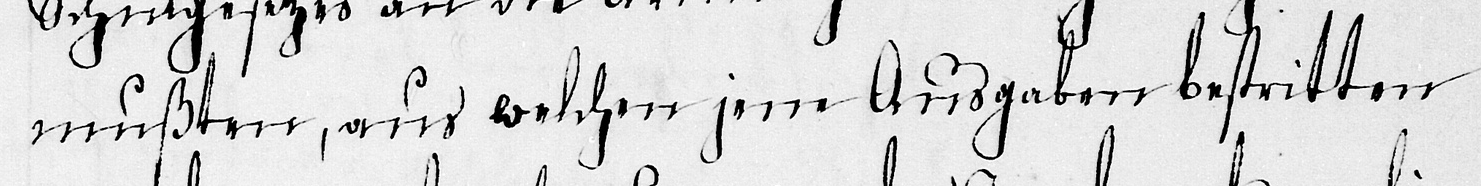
mußten, aus welchen jene Ausgaben bestritten
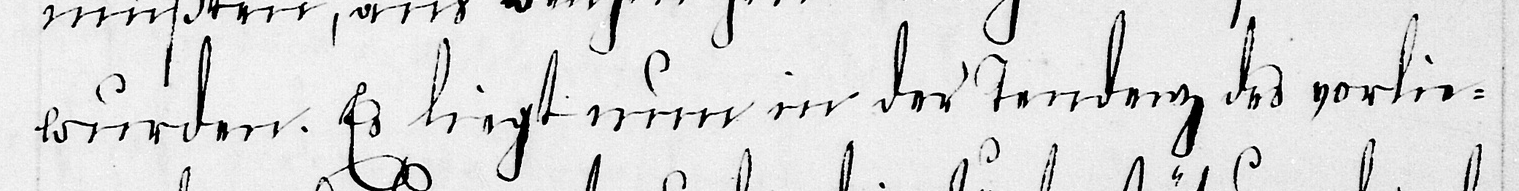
wurden. Es liegt nun in der Tendenz des vorlie¬
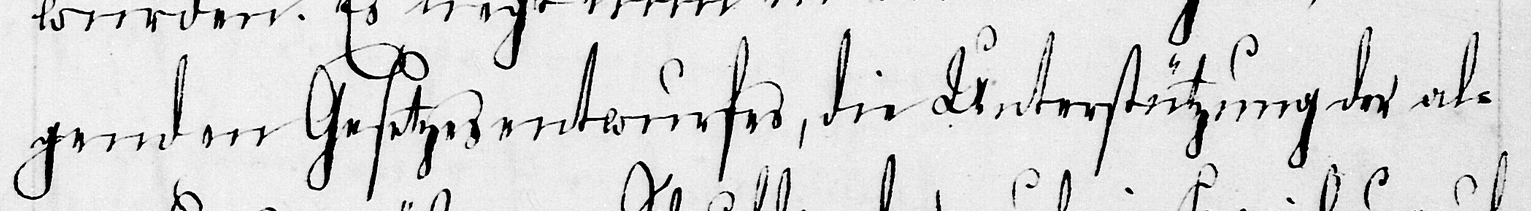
genden Gesetzesentwurfes, die Unterstützung der al¬
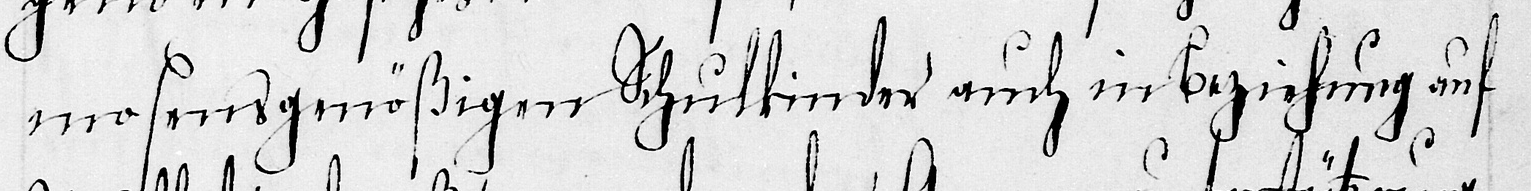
mosensgenößigen Schulkinder auch in Beziehung auf
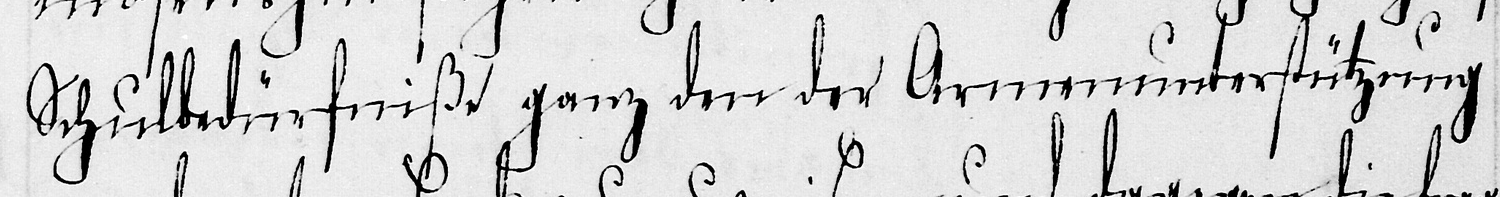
Schulbedürfniße ganz den der Armenunterstützung
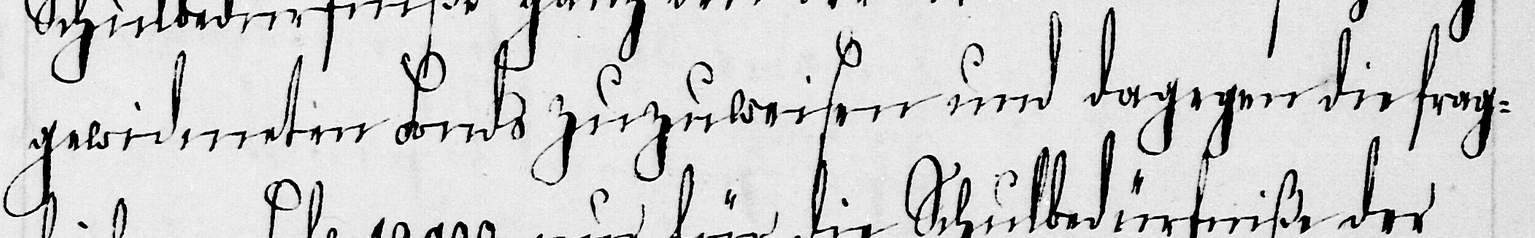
gewidmeten Fonds zuzuweisen und dagegen die frag¬
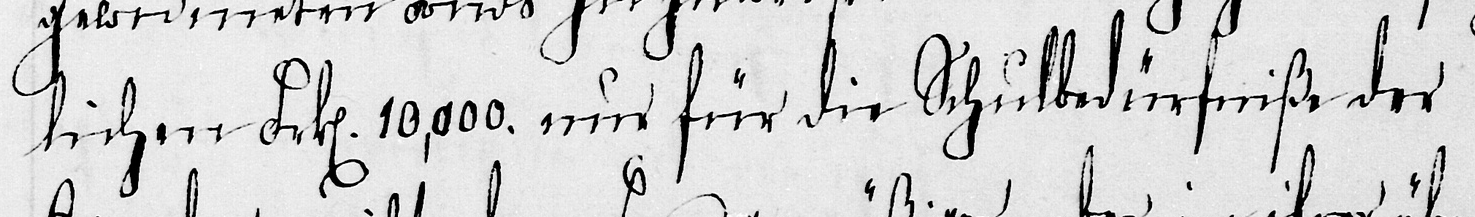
lichen Frk[en]. 10,000. nur für die Schulbedürfniße der
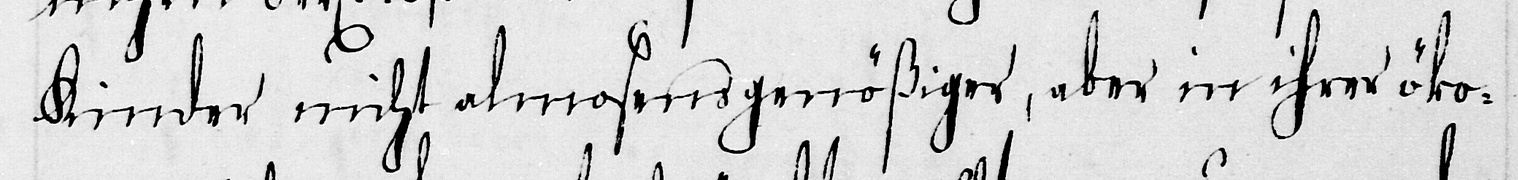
Kinder nicht almosensgenößiger, aber in ihrer öko¬
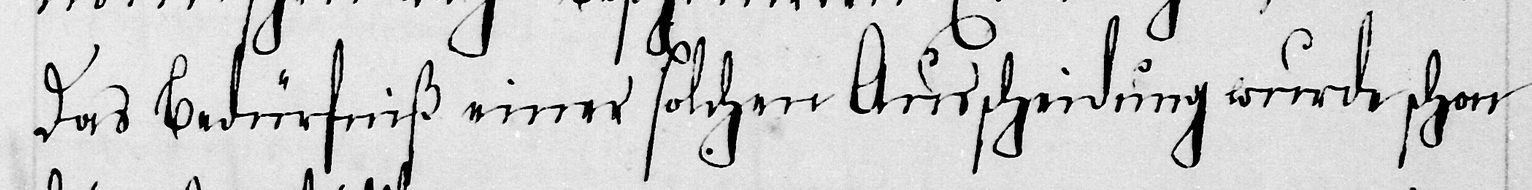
Das Bedürfniß einer solchen Ausscheidung wurde schon
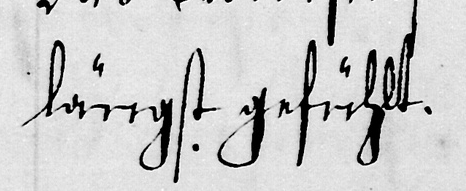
längst gefühlt.
